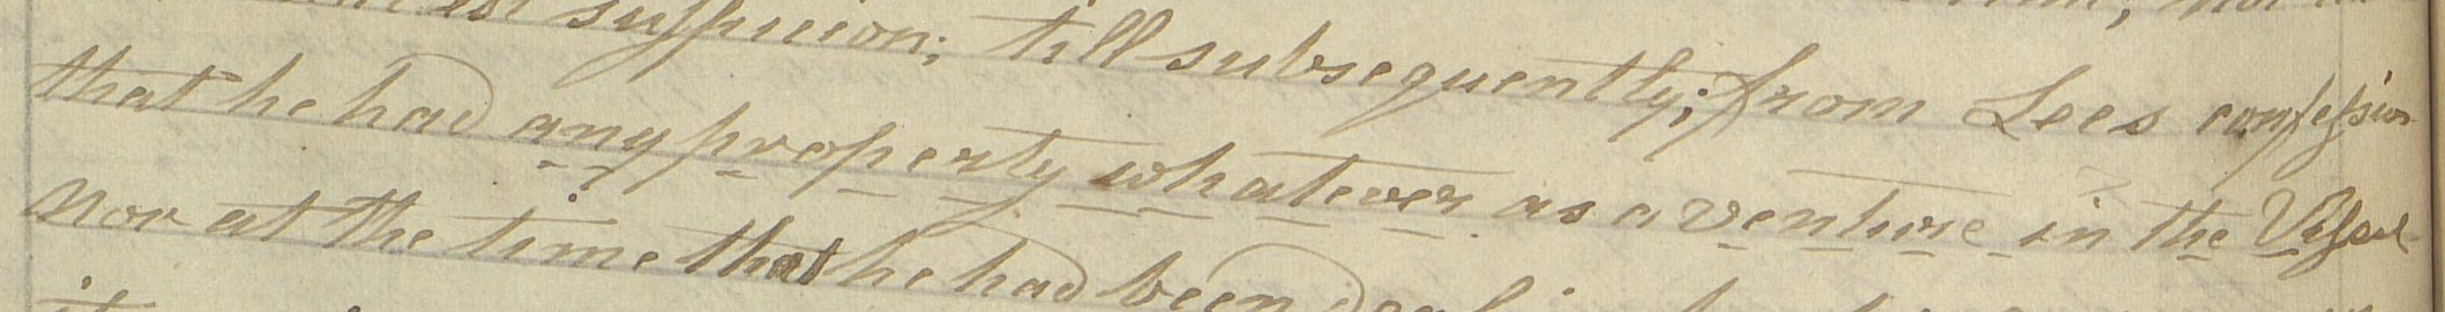that he had any property whatever as a venture in the Vessel
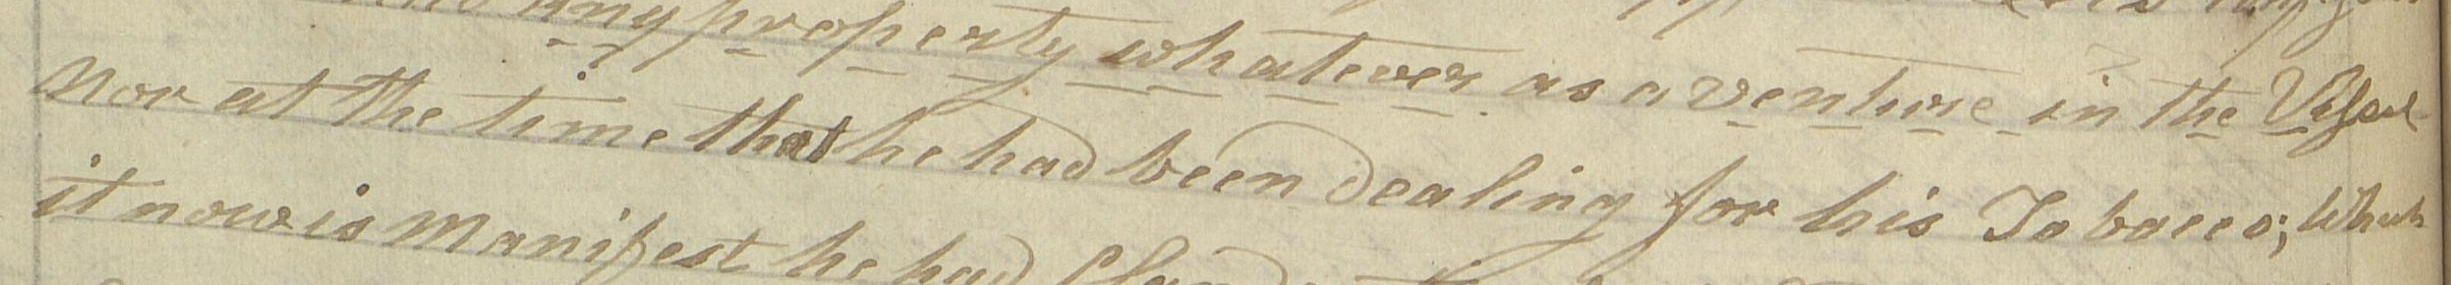nor at the time that he had been dealing for his Tobacco, Which
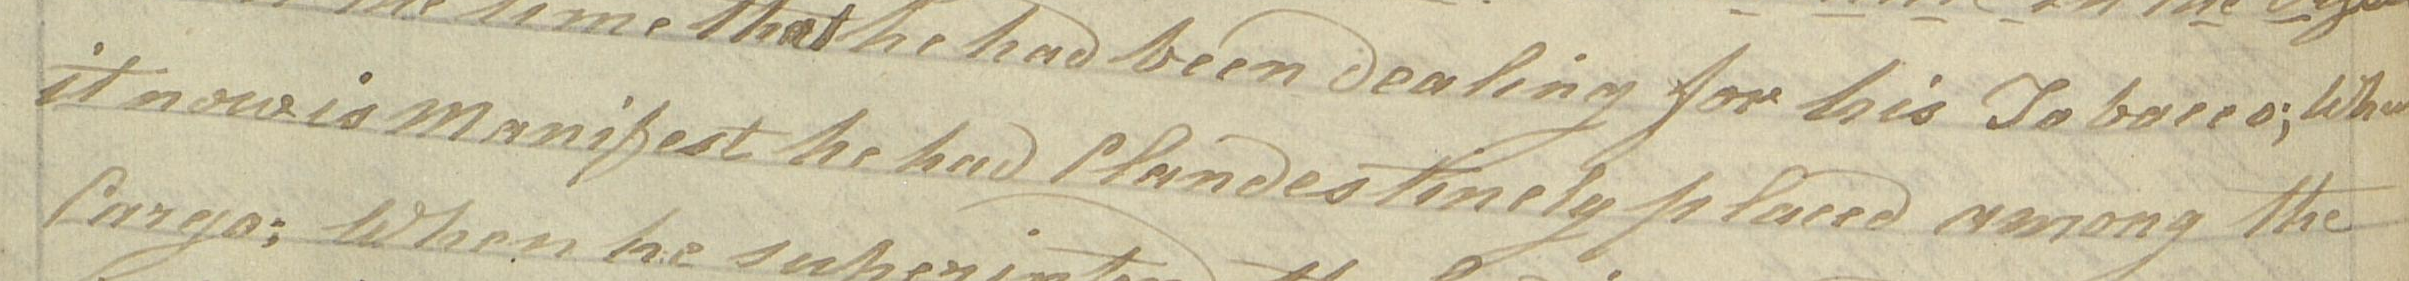it now is manifest he had Clandestinely placed among the
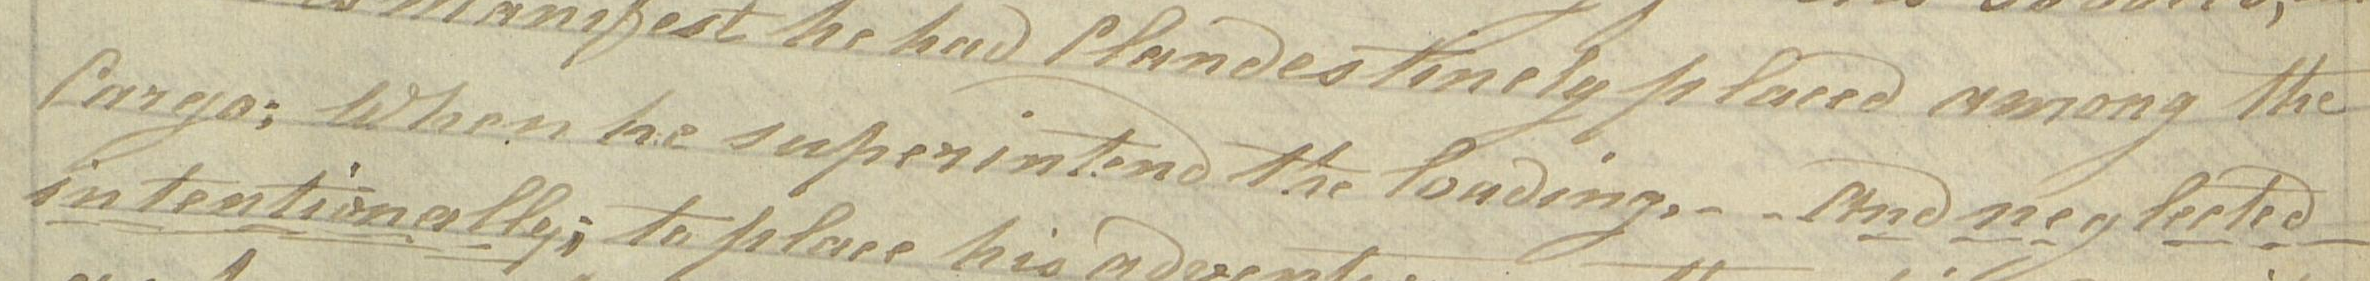Cargo: When he superintend the loading, And neglected
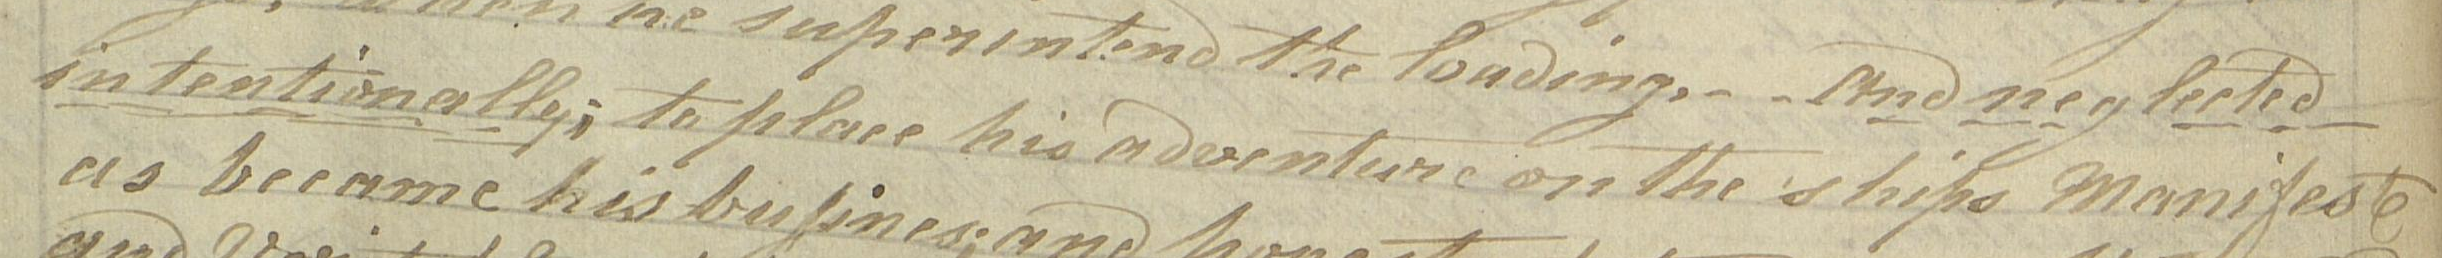intentionally; to place his adventure on the ships Manifest
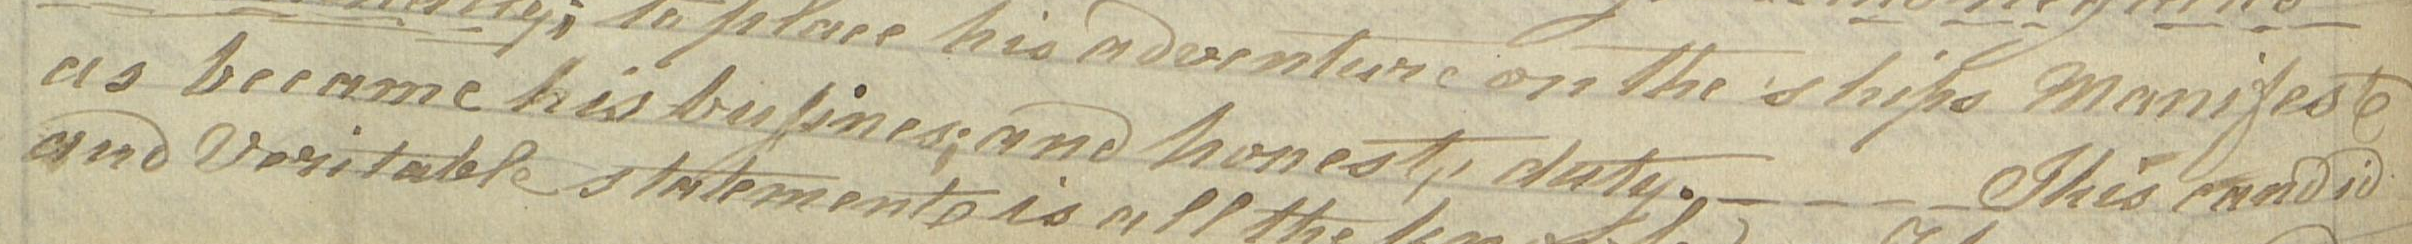as became his business; and honest duty. This candid
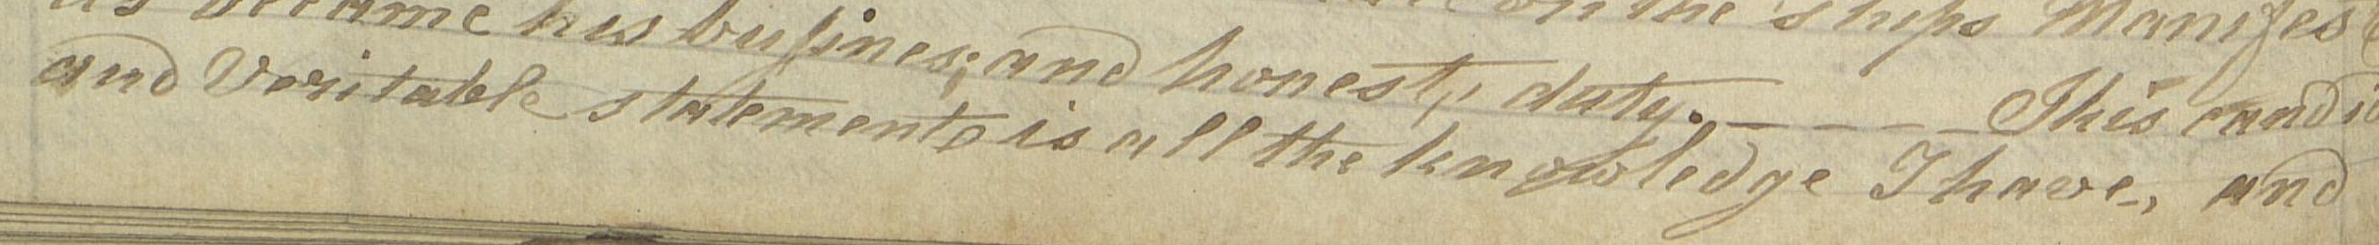and Veritable statement is all the knowledge I have, and
